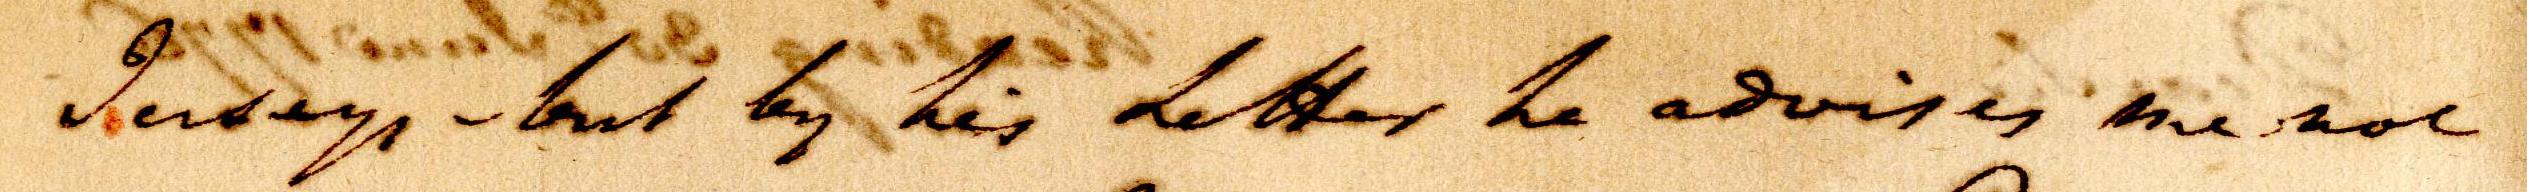Jersey, but by his Letter he advises me not
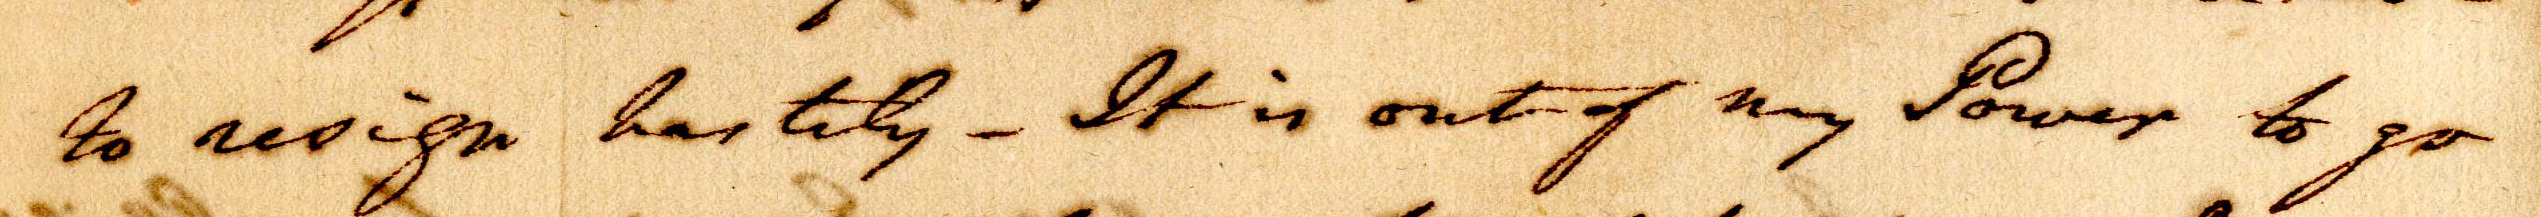to resign hastely. It is out of my Power to go
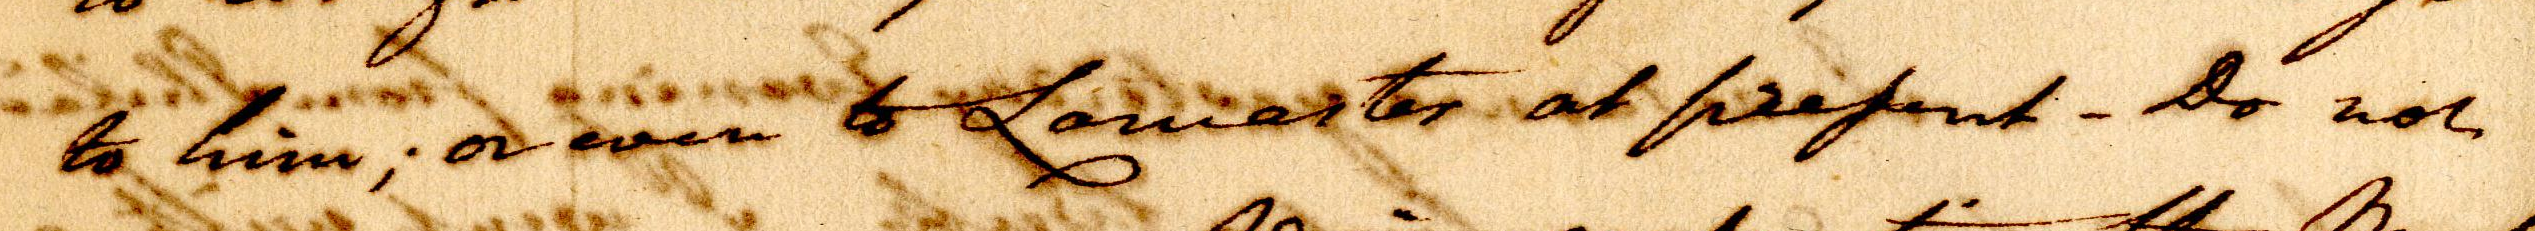to him; or even to Lancaster at present. Do not
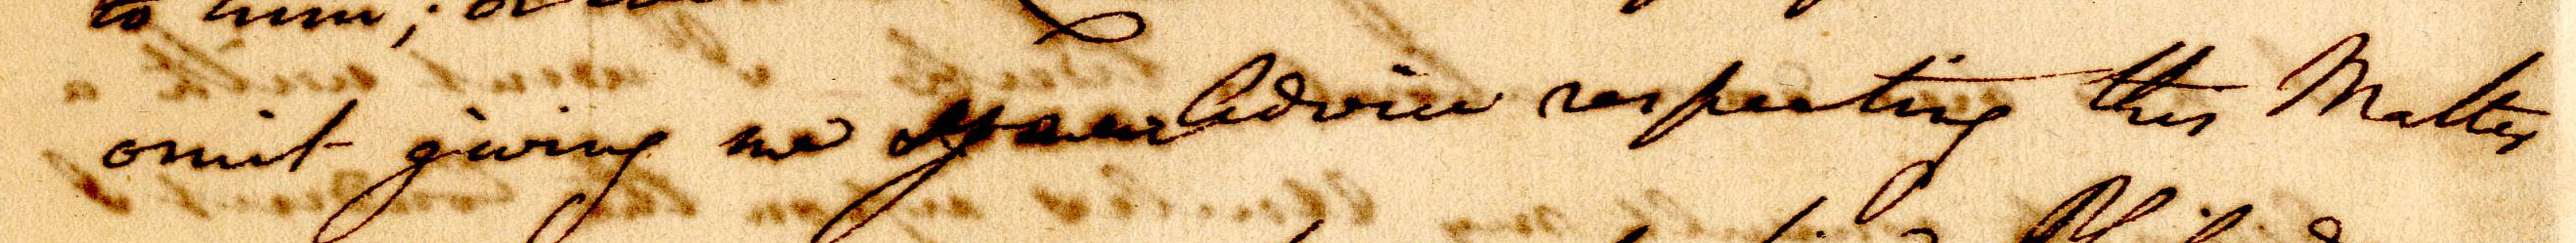omit giving me your Advice respecting this Matter
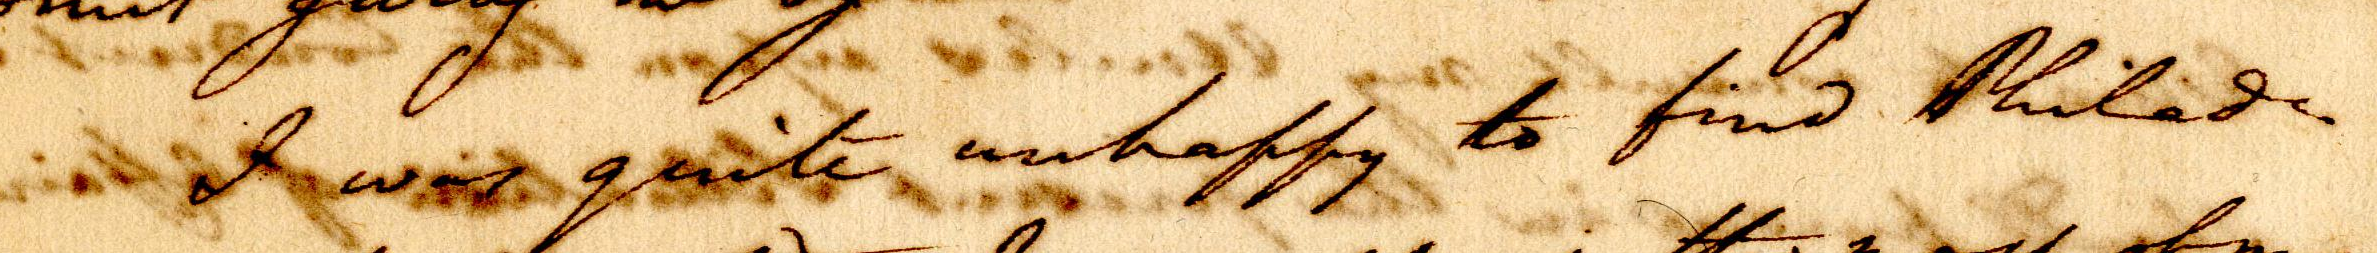I was quite unhappy to find Philad^a
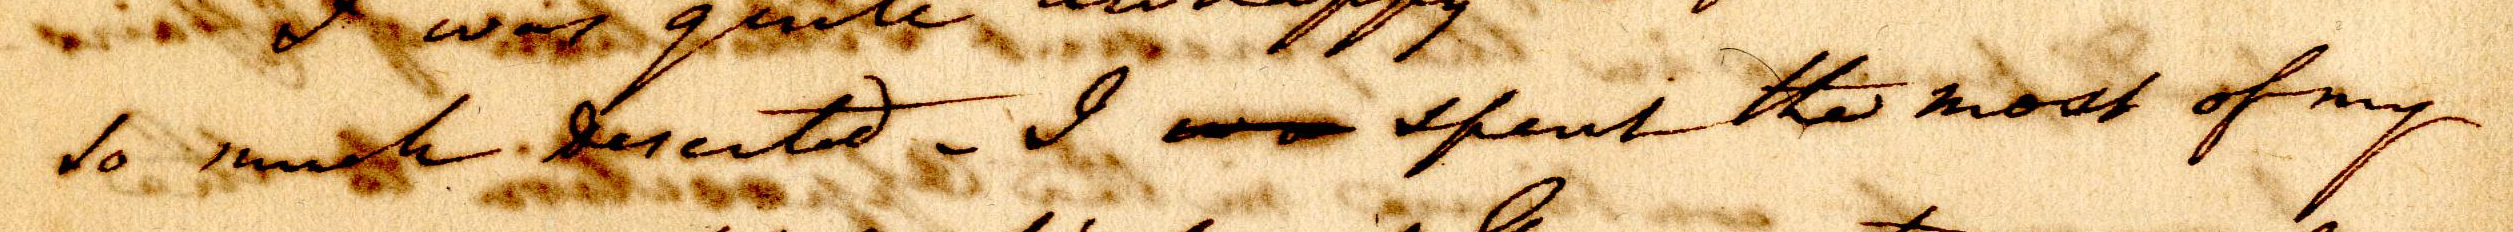so much Deserted. I even spent the most of my
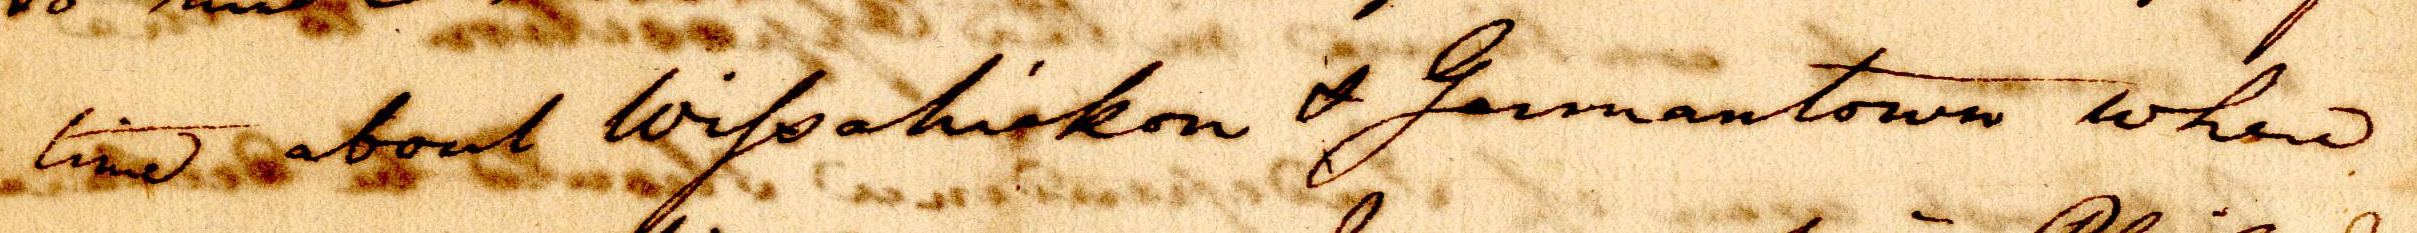time about Wissahickon & Germantown where
